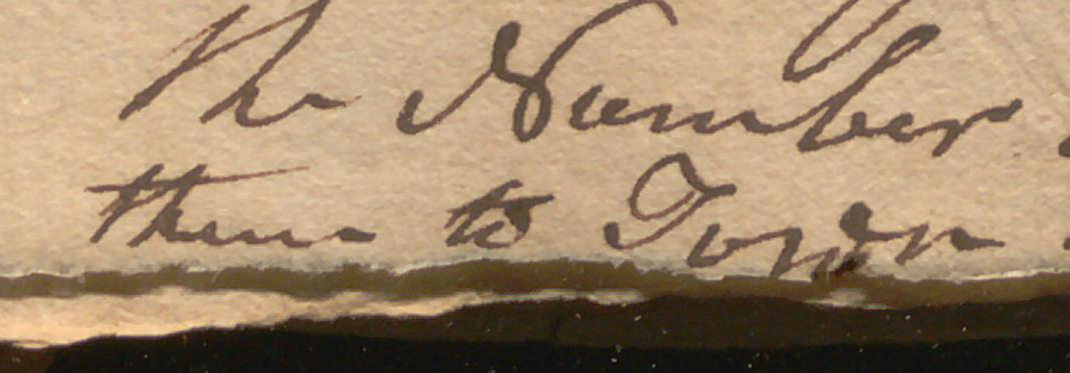them to Town
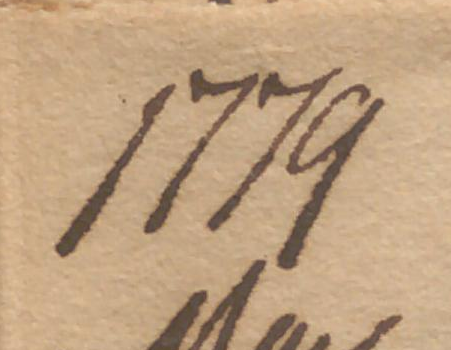1779
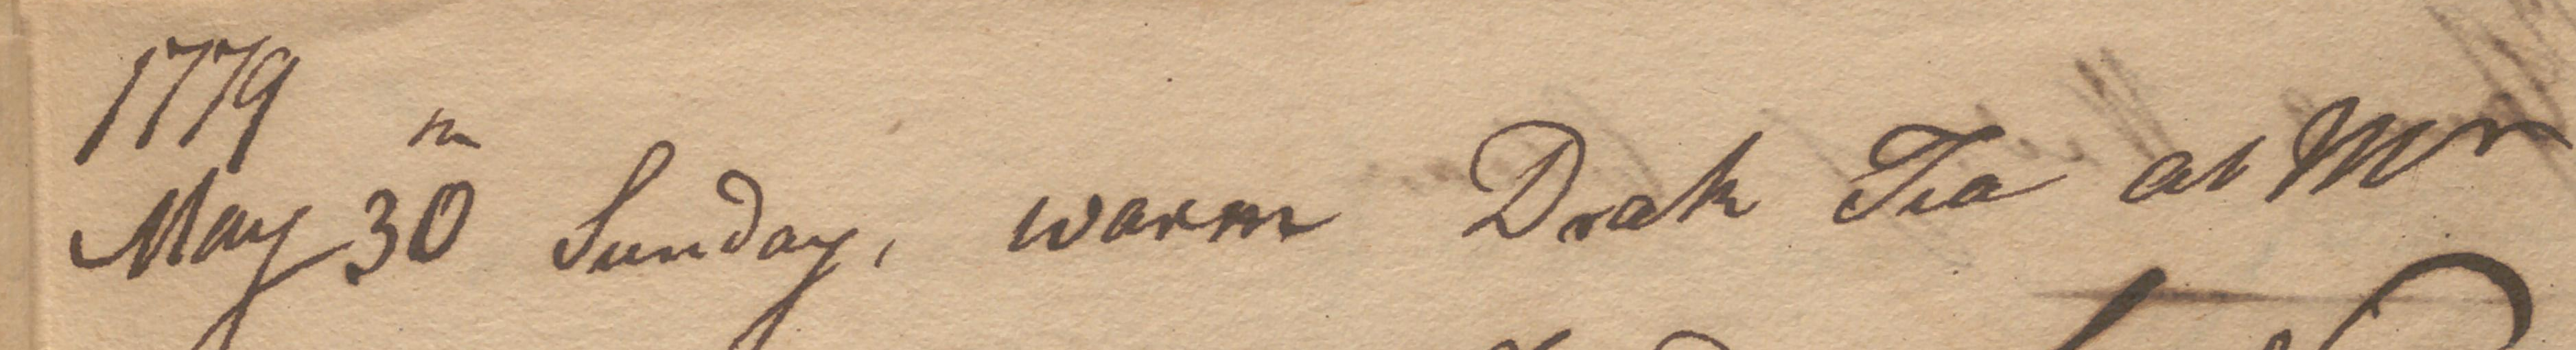May 30^th Sunday, warm Drak Tea as M^r
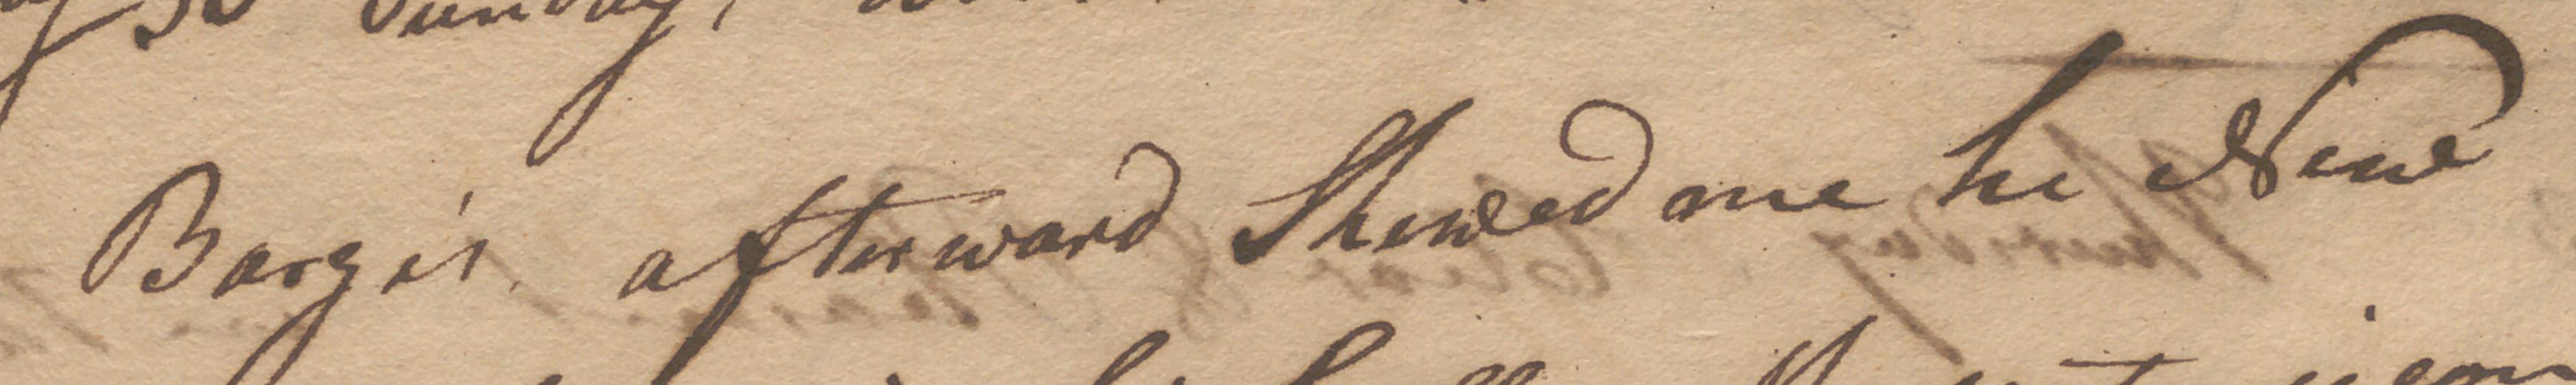Barge's afterward Shewed one he New
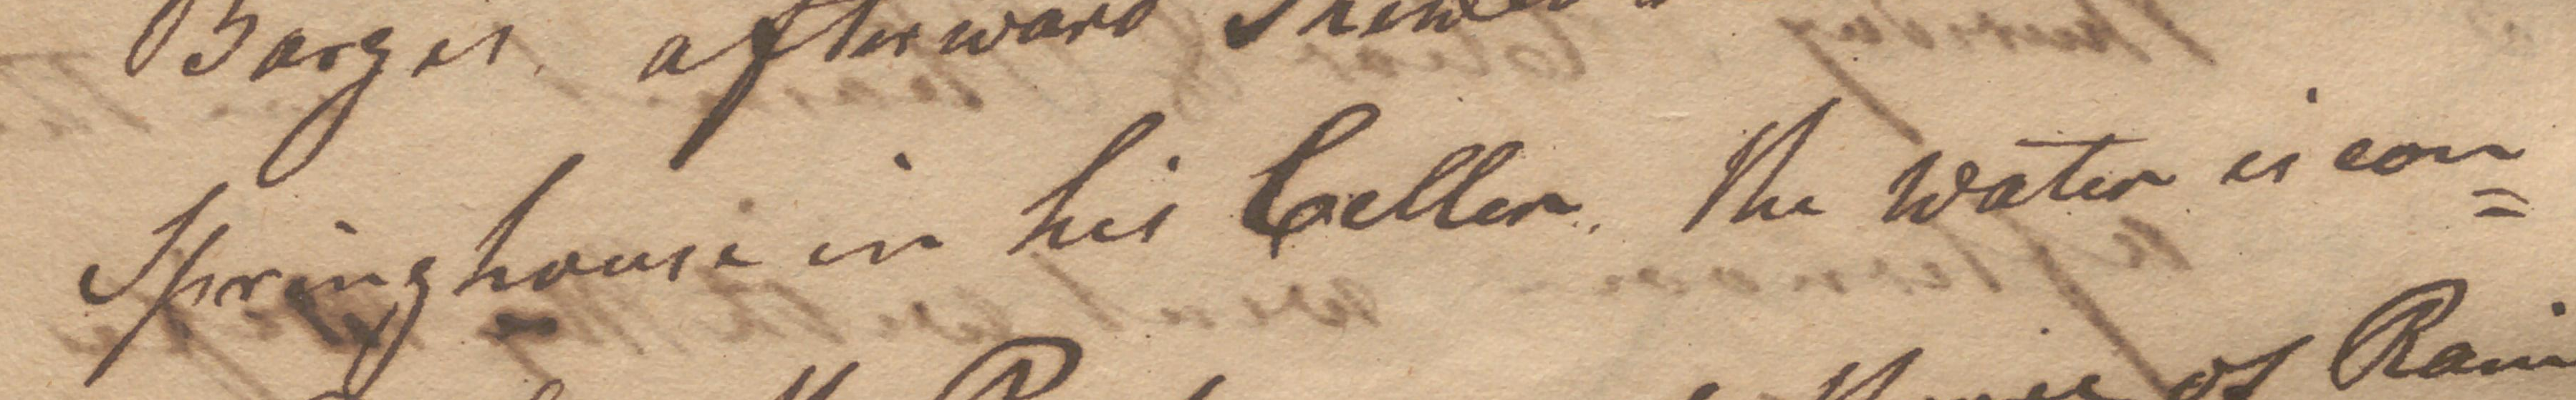Springhouse in his Celler. the Water is con-
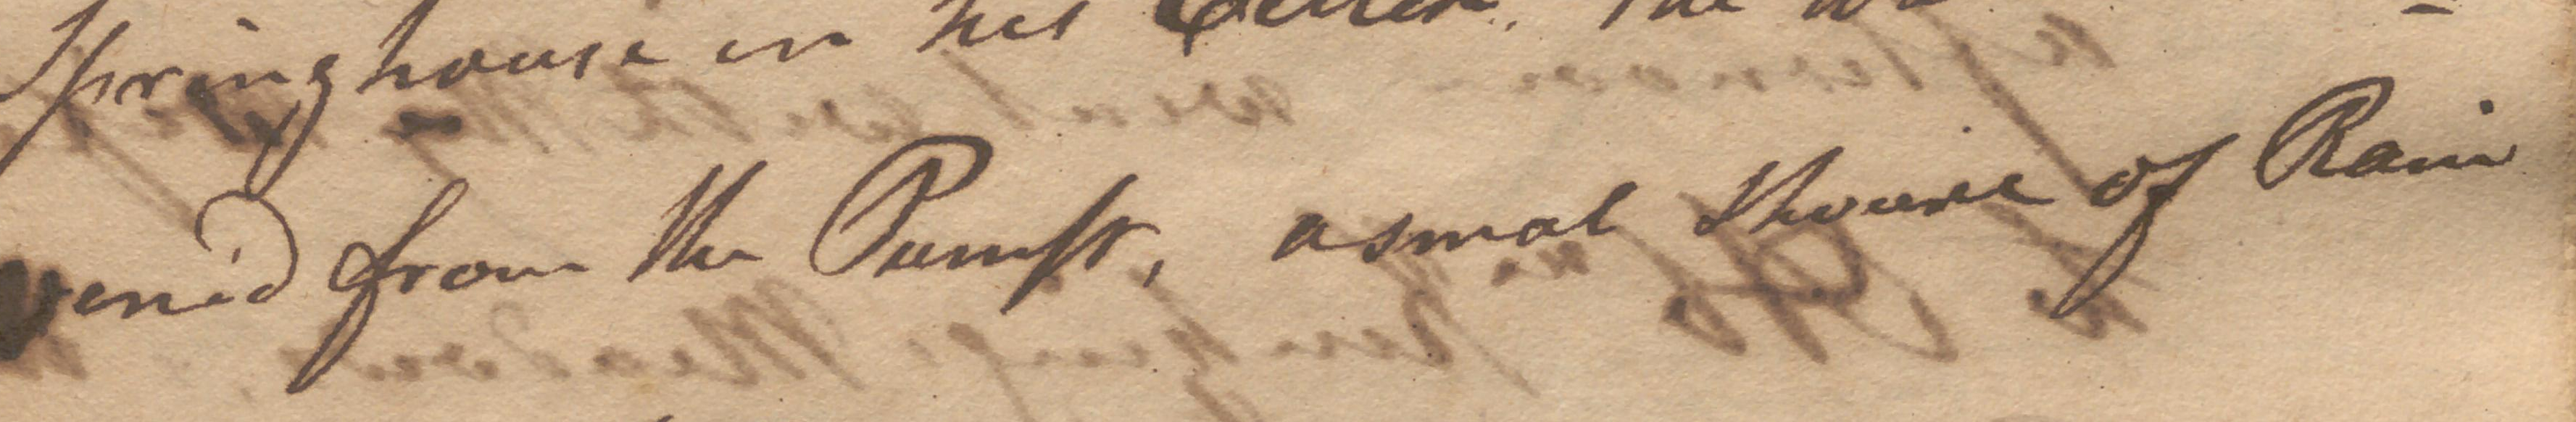ened from the Pump, a smal shoure of Rain
